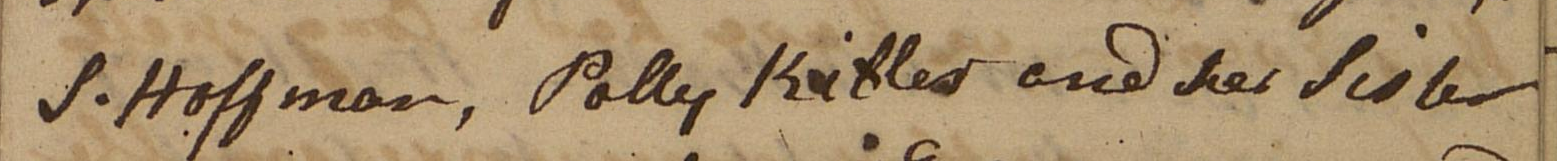S. Hoffman, Polly Kitler and her Sister
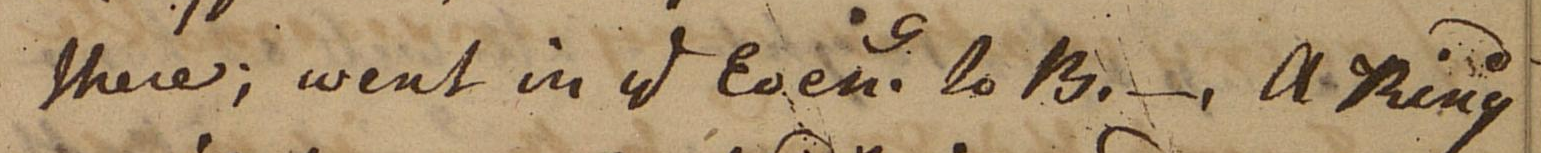there; went in y^e Even^g. to B.-, A Ring^d
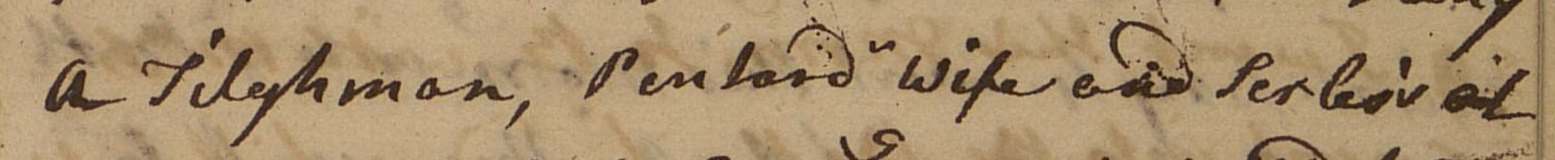A Tilghman, Pentard^s wife and Serles's at
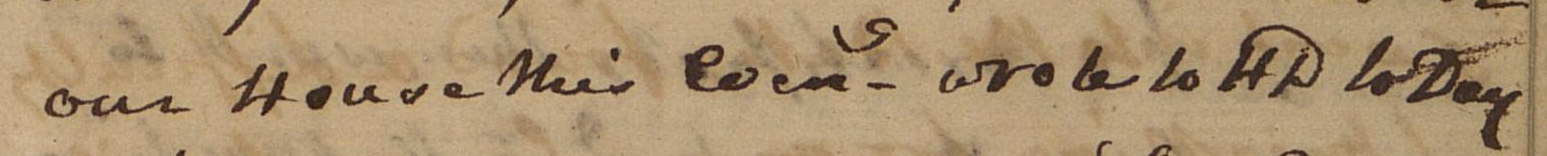our House this Even^g- wrote to HD to Day
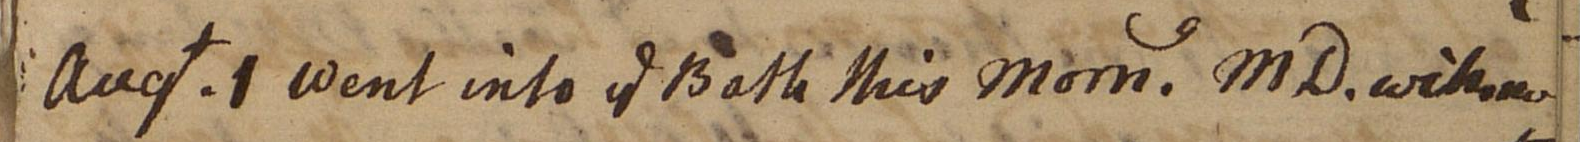Aug^t. 1 went into y^e Bath this Morn^g. MD. wih me
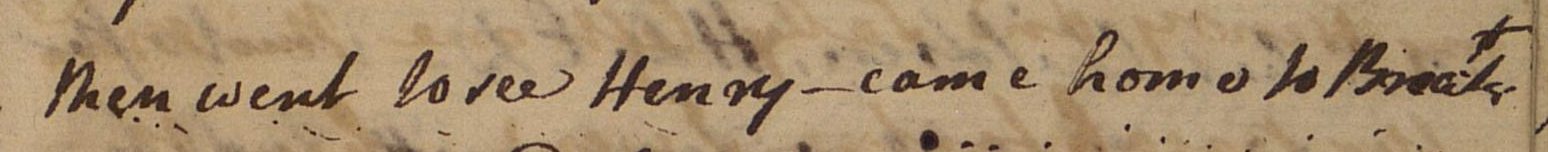then went to see Henry- came home to Break^t.
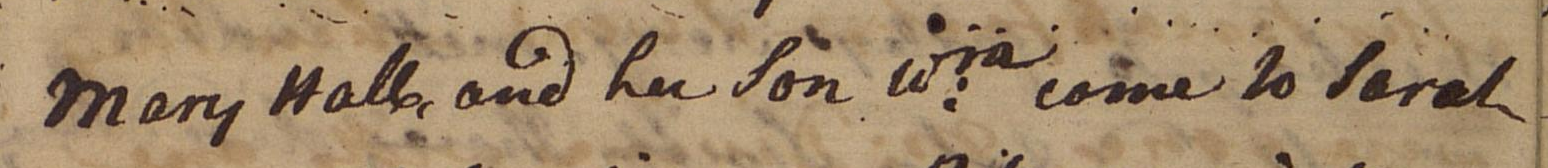Mary Hall, and her son W^m: come to Sarah
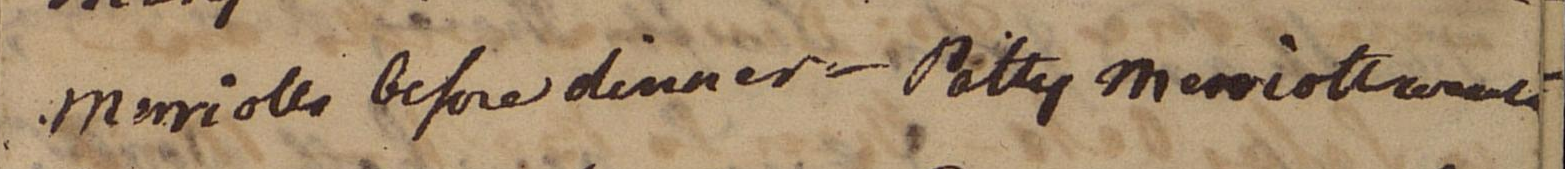Merriotts before dinner- Patty Merriott wrote
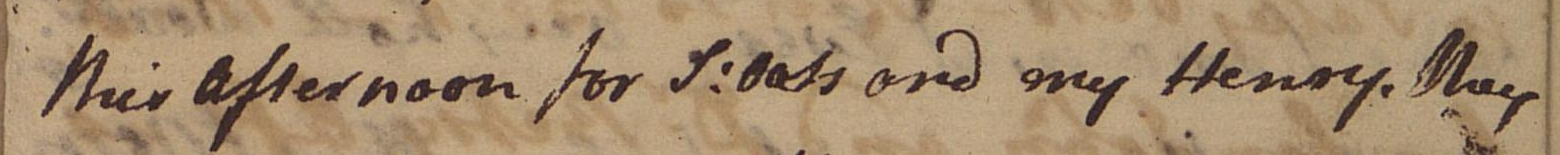this Afternoon for S: Oats and my Henry. they
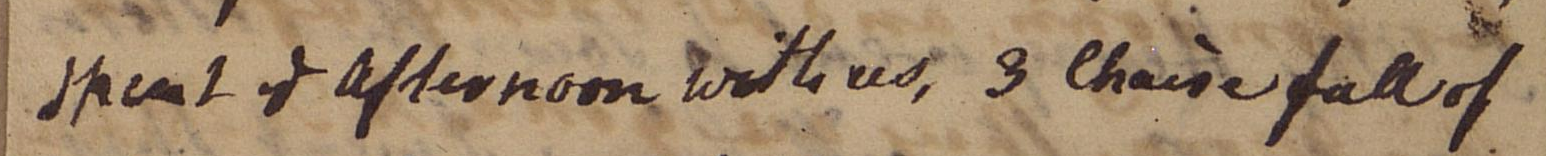spent y^e afternoon with us, 3 Chaise full of
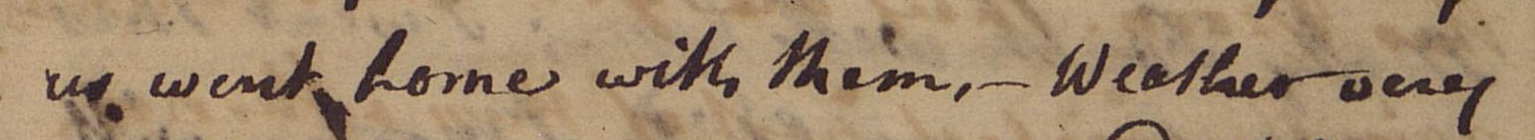us went home with them,- Weather very
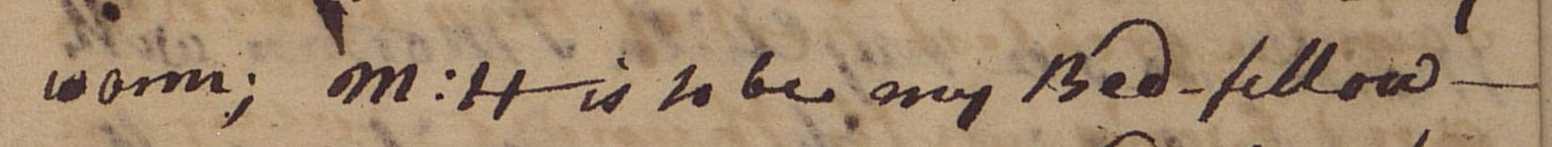warm; M:H is to be my Bed- fellow-
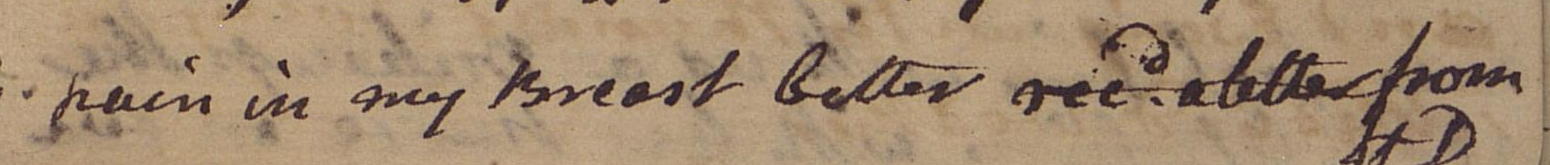pain in my Breast better rec^d. a letter from
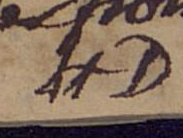HD
